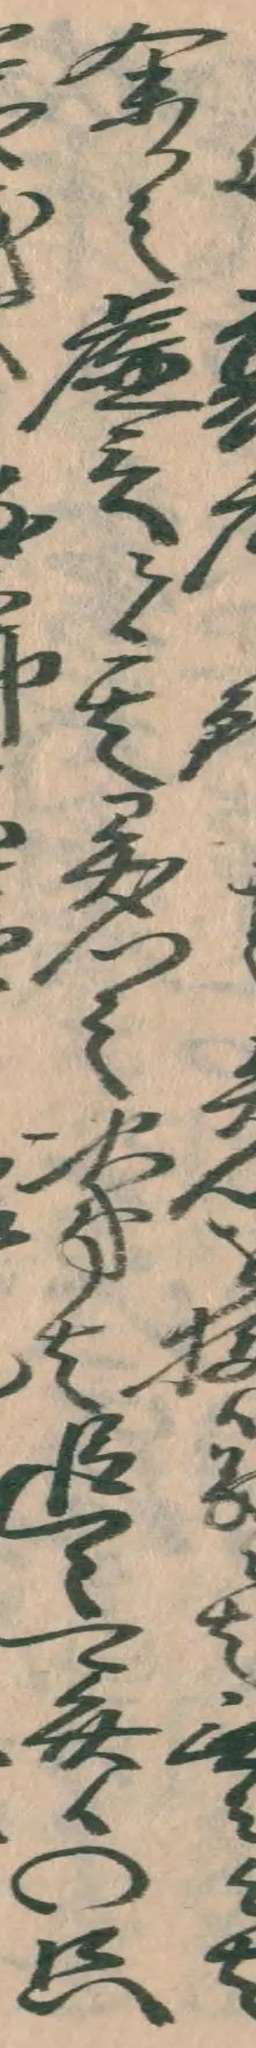余り之虚言ニ候其異心之次第者追々可弁候〇只
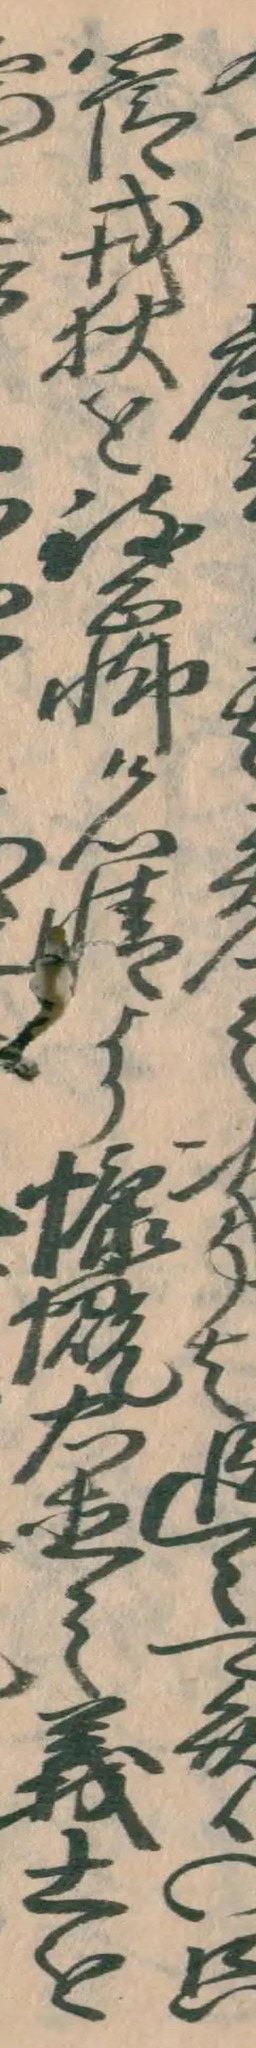管戎狄を致恐怖候心情より慷慨忠直之義士を
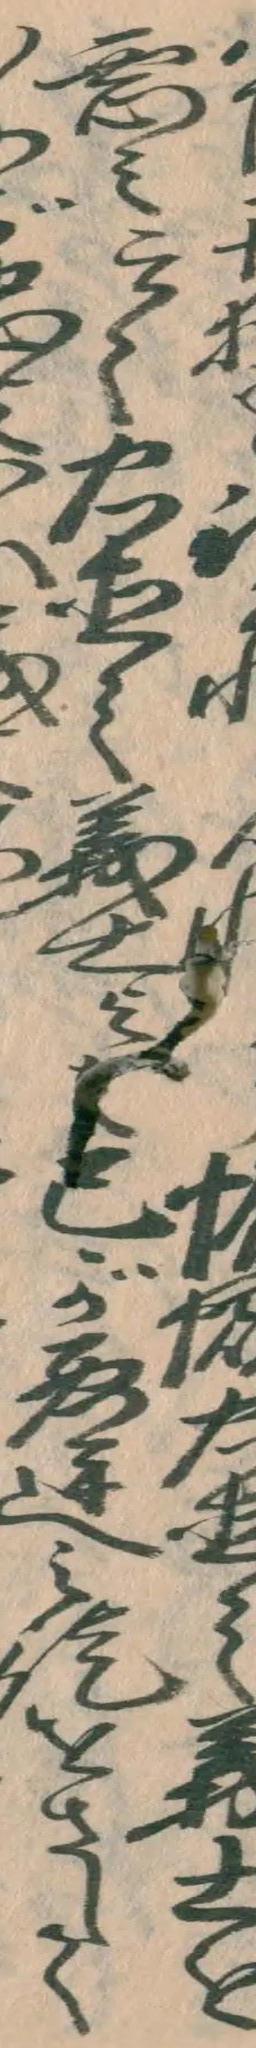悪ミ云々忠直之義士と者己が悪逆之徒をさして
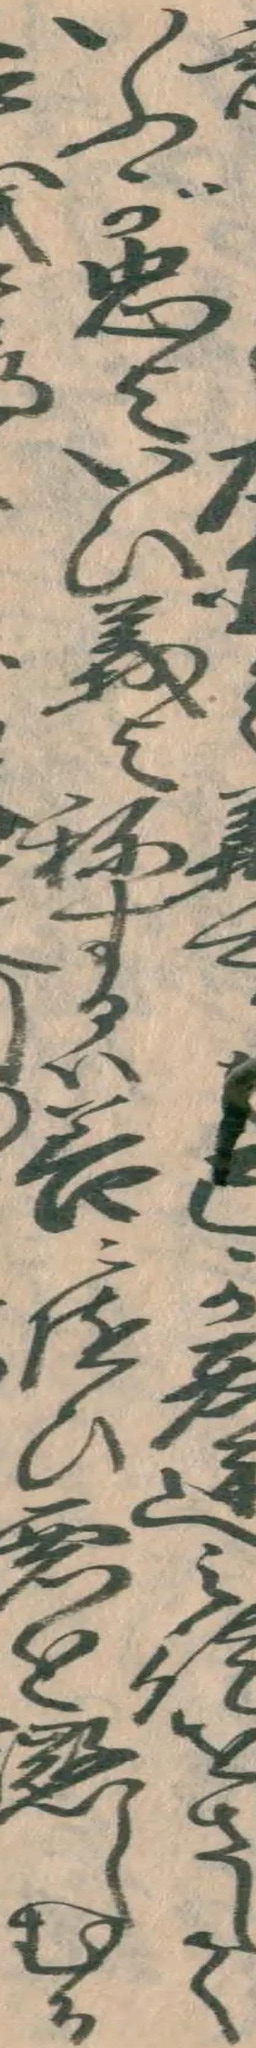いふが忠といひ義と称するハ善ニ随ひ悪を懲しむる
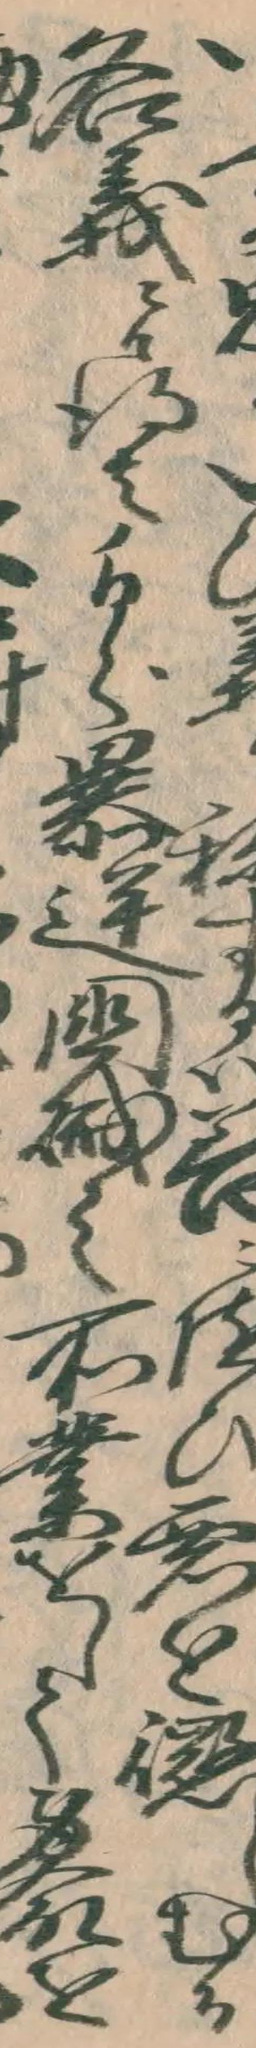名義ニ候得者自ら暴逆国賊之所業をして身命を
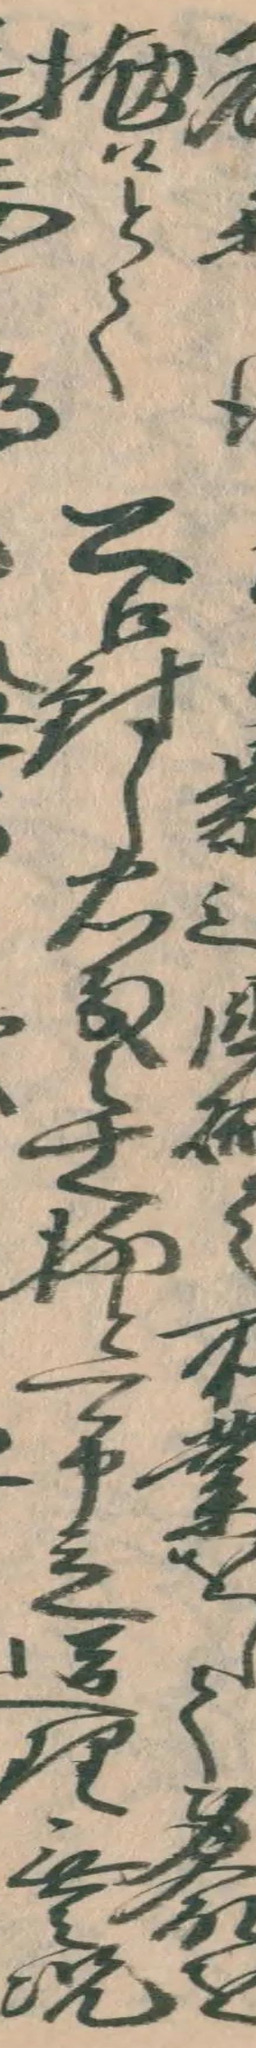抛候とて公江對し忠義之士抔と可申立道理無之况
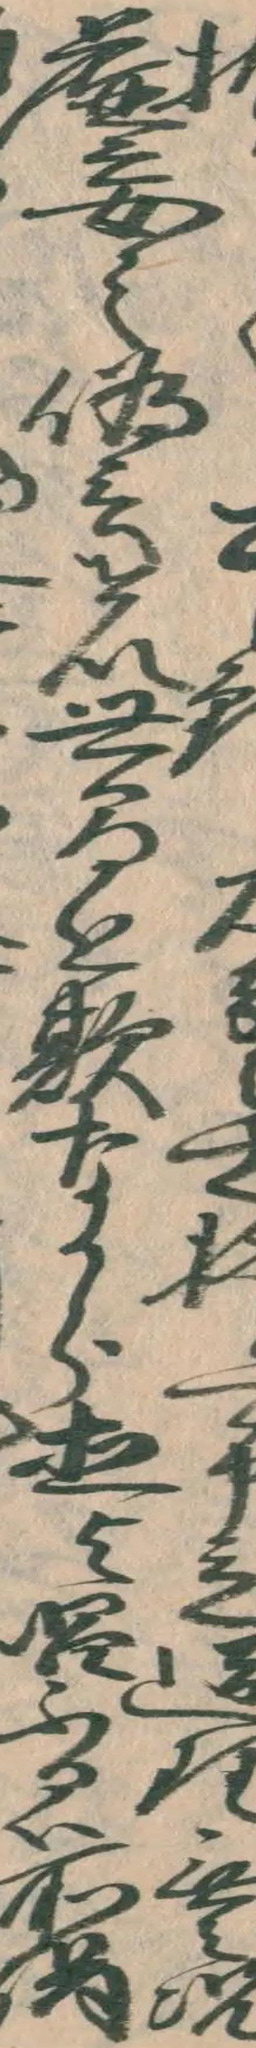虚妄之偽言を以世間を欺なから直と唱ふるハ所謂
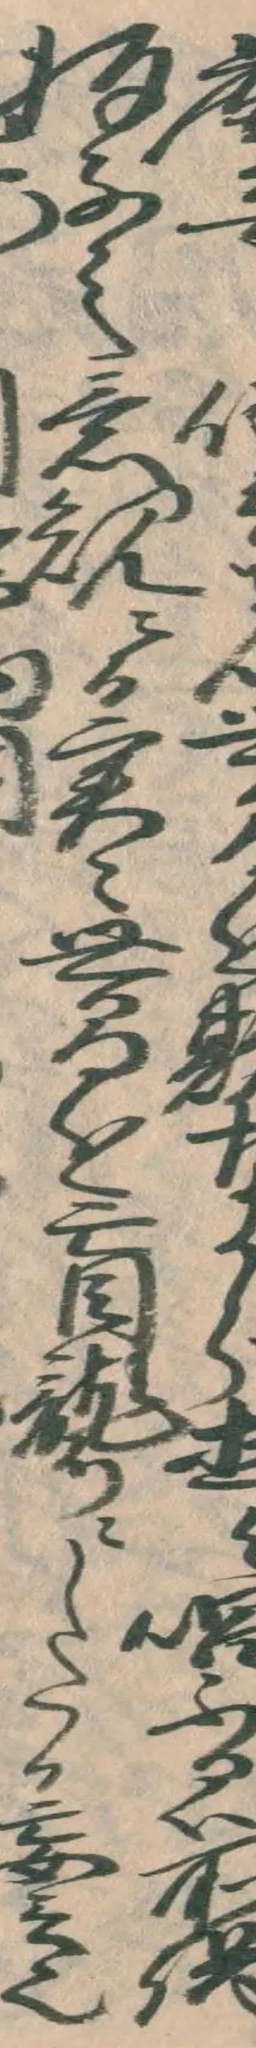杓子之意規ニ而実ニ世間を盲聾ニしたる妄言也
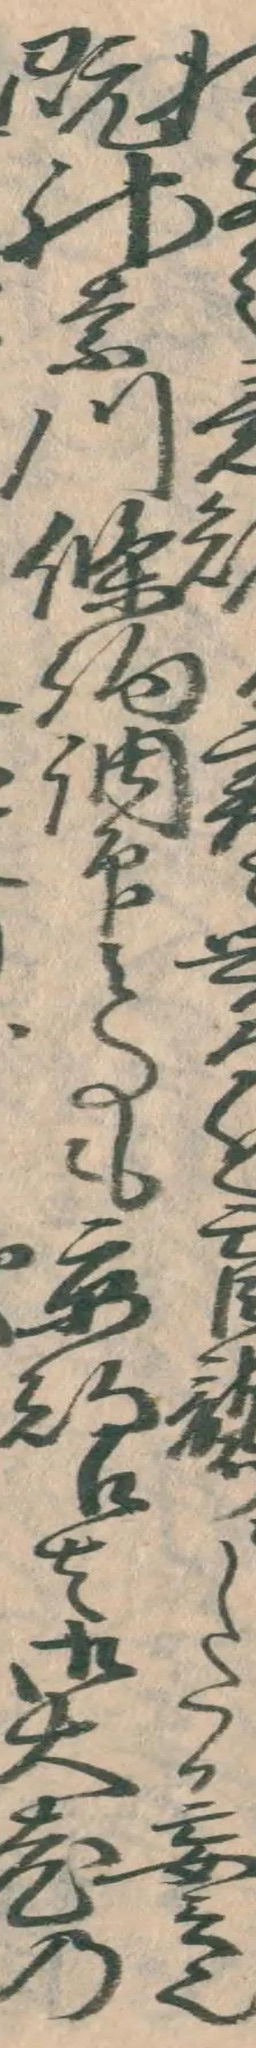既神奈川條約調印之事も京都江者御大老の
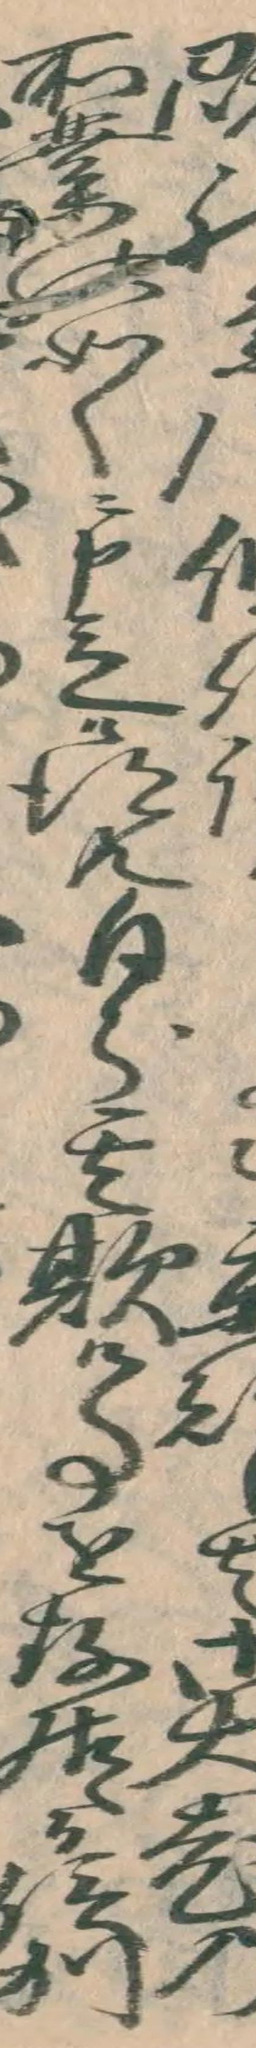所業の如くニ申立候得共自ら其欺候事を存居候而信州
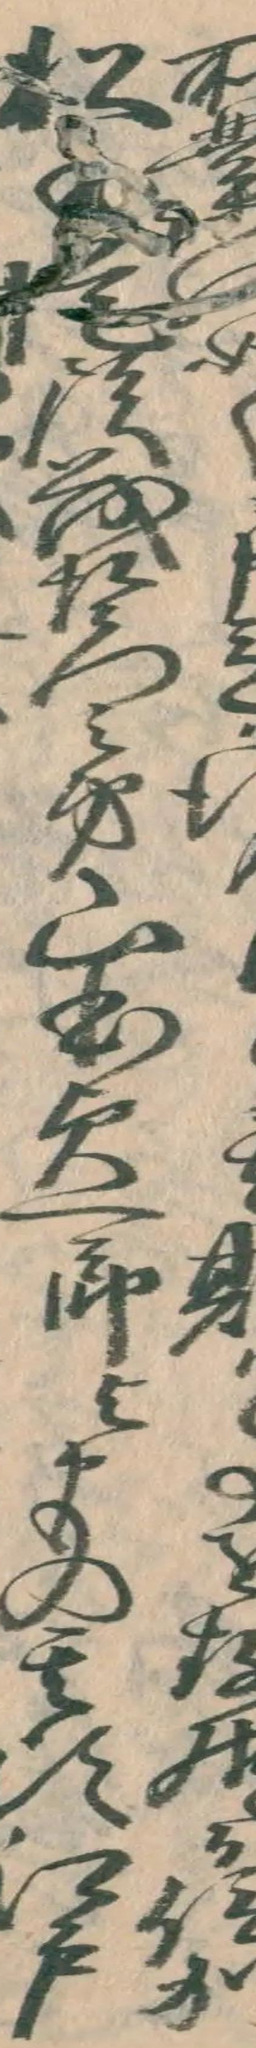松本権頭茂左衛門之弟山本貞一郎と申もの其頃江戸
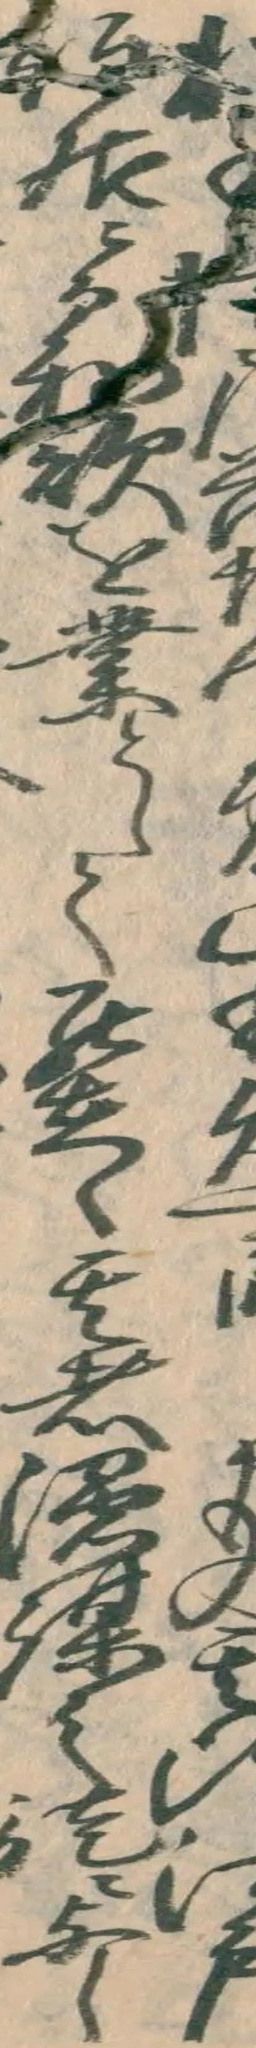住居ニ而和歌を業として罷在候其者隠謀之徒ニ与し
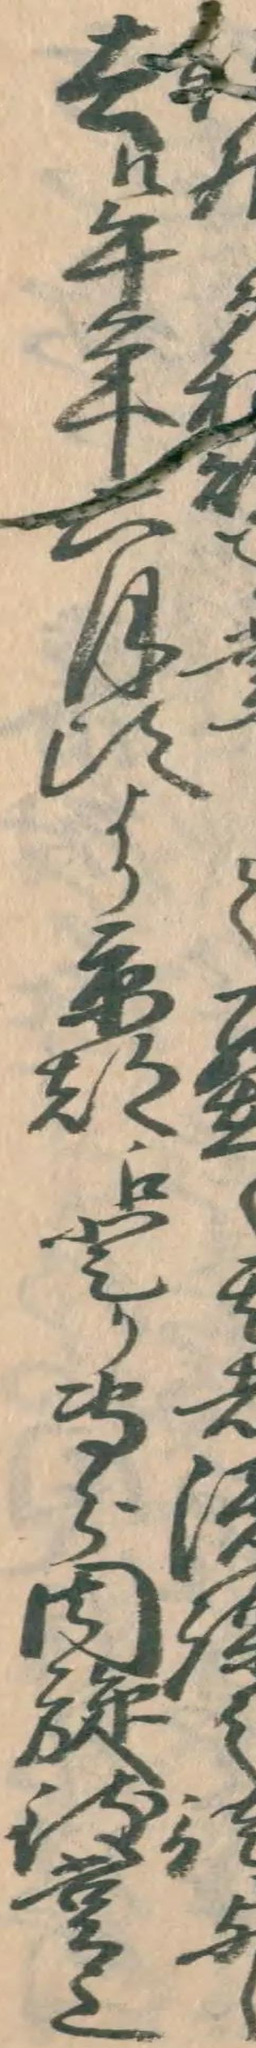去ル午年六月頃より京都江登り専ら周旋致堂上

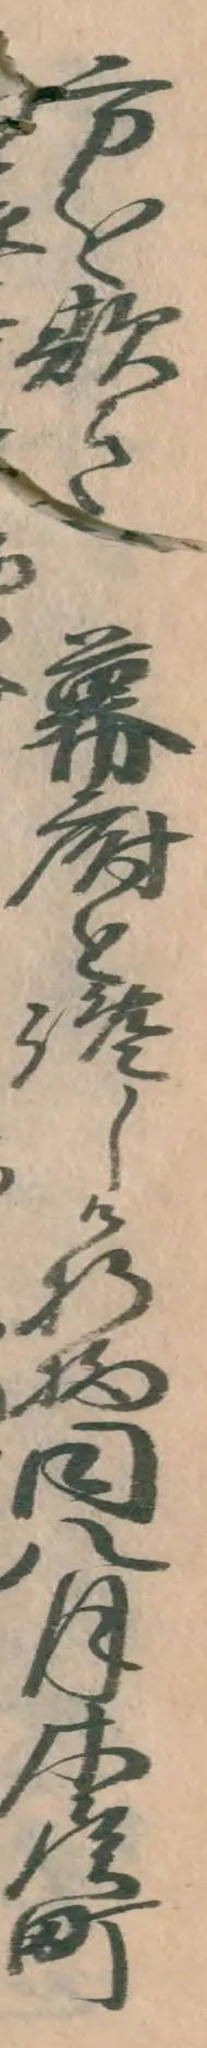方を欺き幕府を讒し候折柄同八月木屋町
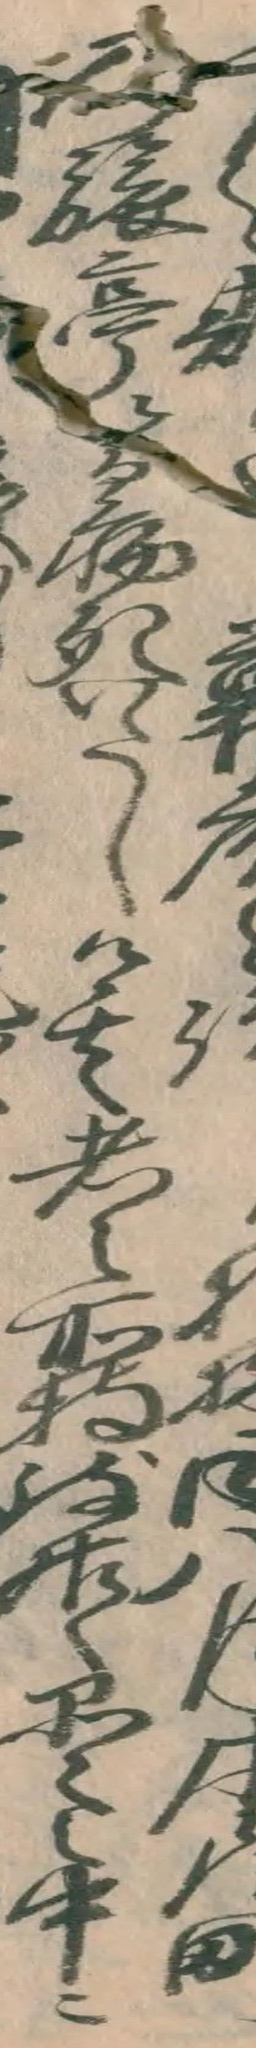の旅亭ニ而病死いたし候其者之所持致居之品々之中ニ
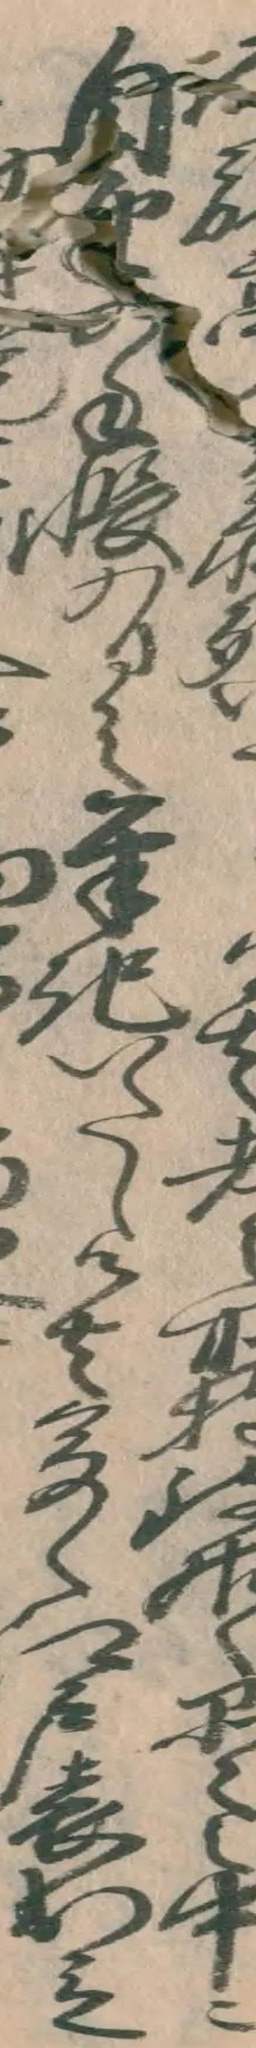自筆の手帳有之筆記致し候者多く江戸表出立
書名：麗斎叢書. 20
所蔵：国立国会図書館 National Diet Library, JAPAN
